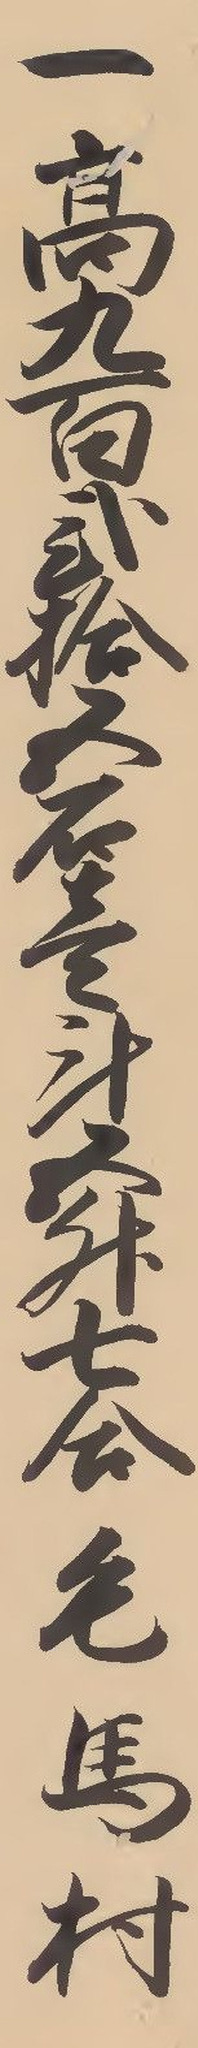一高九百弐拾五石壱斗五升七合毛馬村
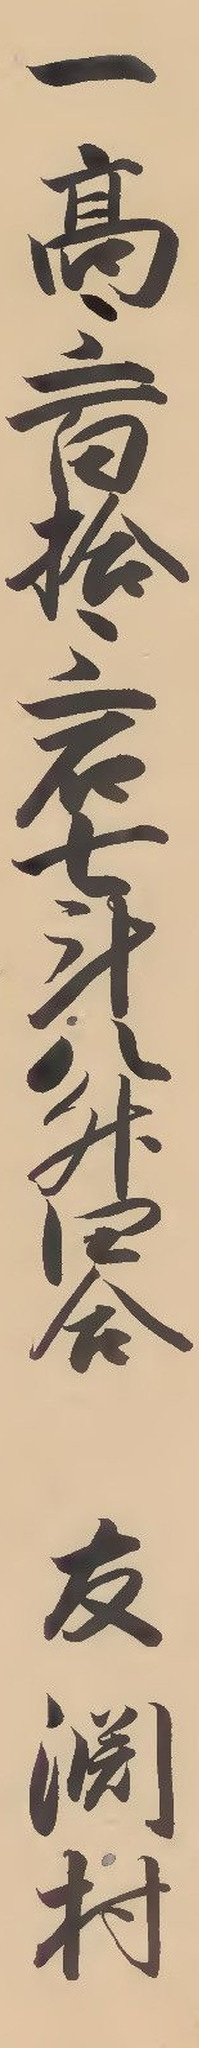一高三百拾三石七斗八升四合友淵村

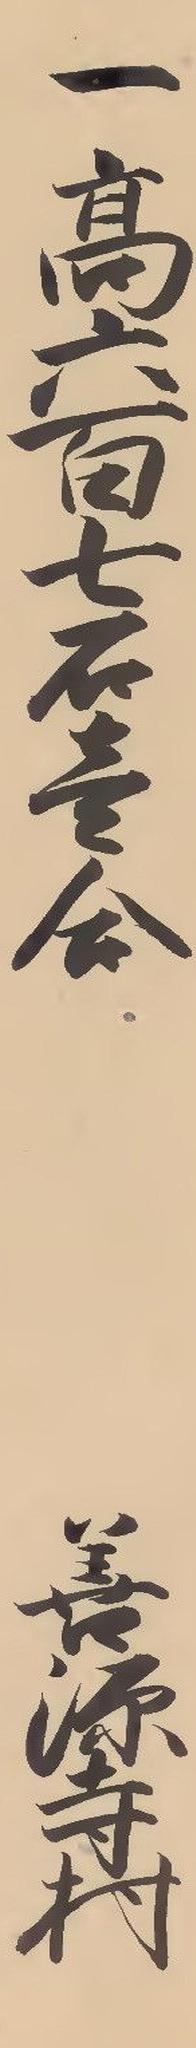一高六百七石壱合善源寺村
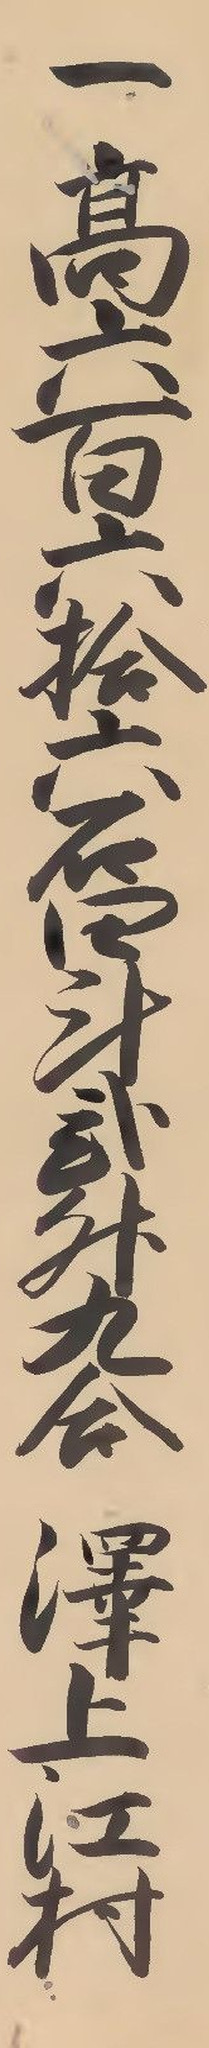一高六百六拾六石四斗弐升九合沢上江村
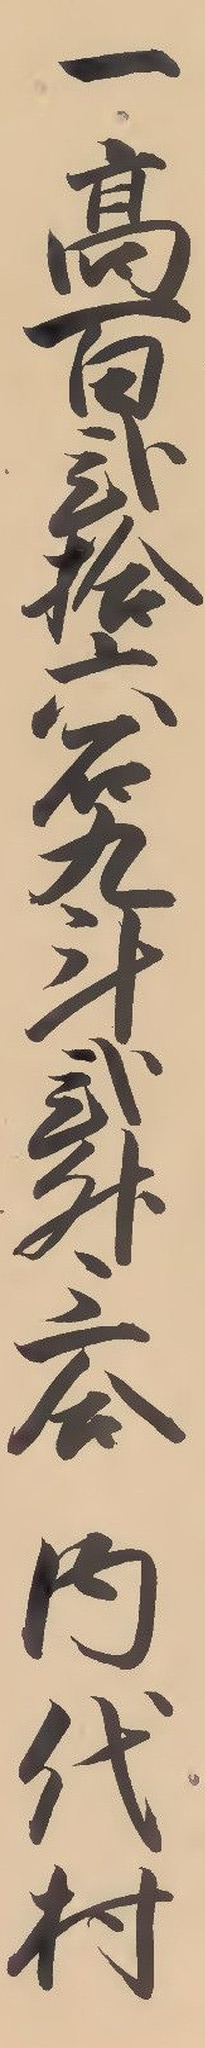一高百弐拾六石九斗弐升三合内代村
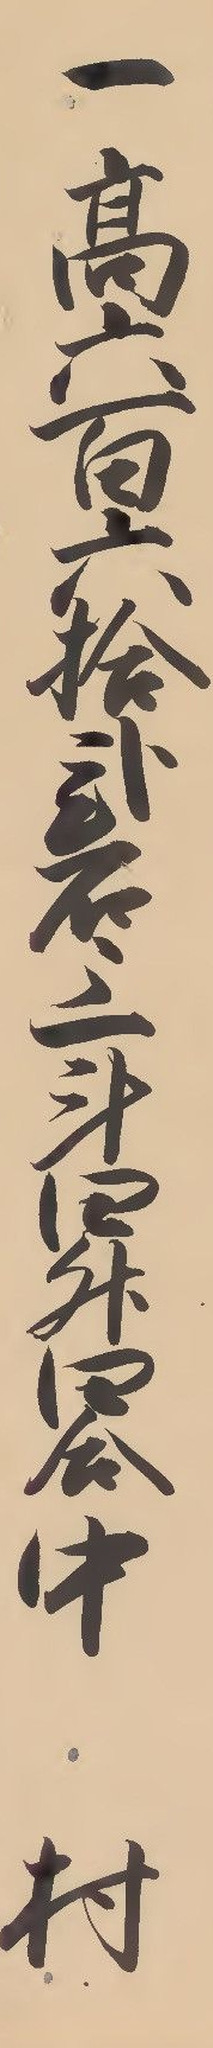一高六百六拾弐石三斗四升四合中村
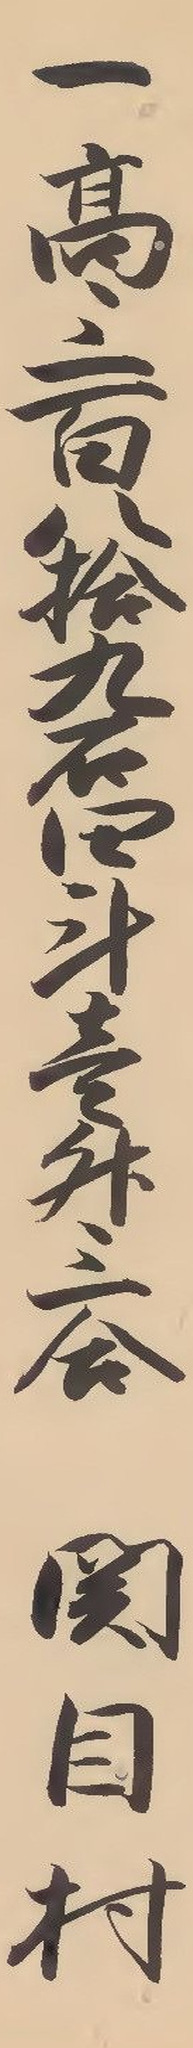一高三百八拾九石四斗壱升三合関目村
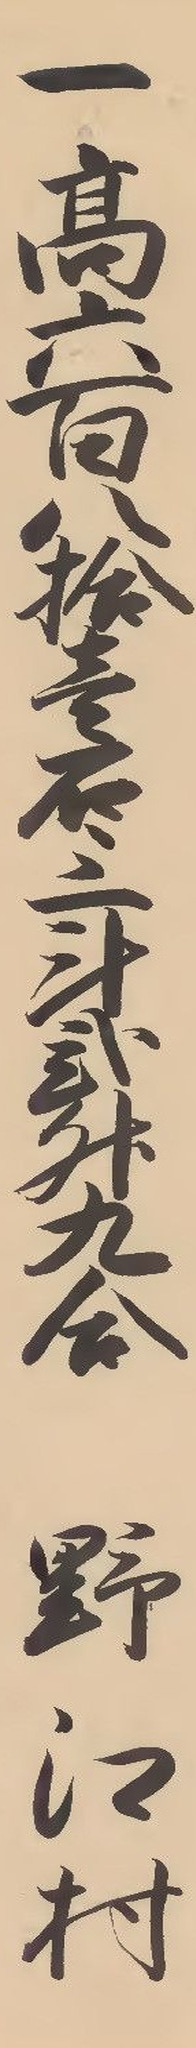一高六百八拾壱石三斗弐升九合野江村
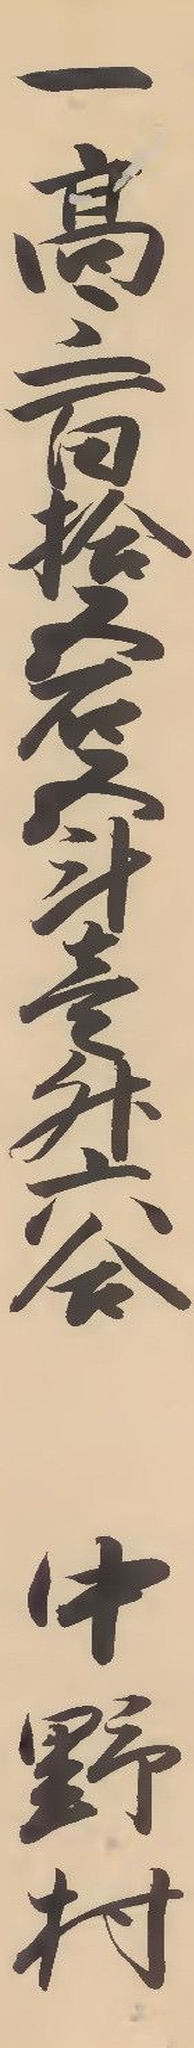一高三百拾五石五斗壱升六合中野村
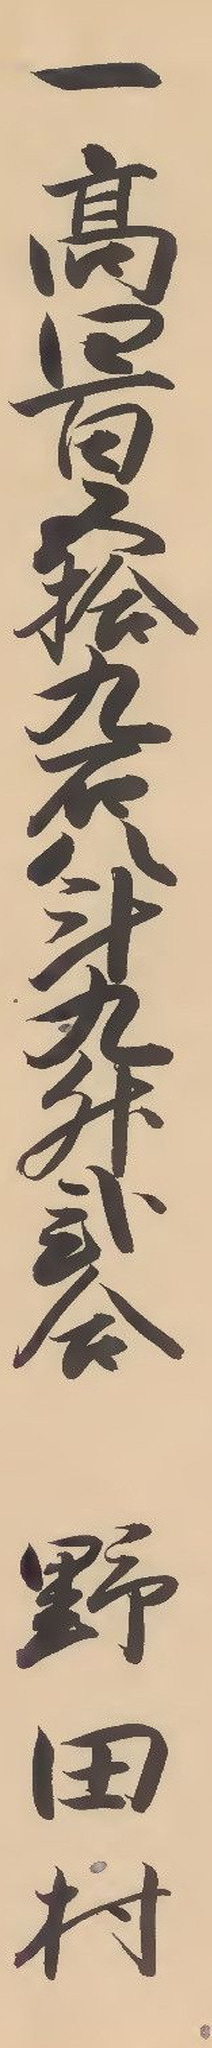一高四百五拾九石八斗九升弐合野田村

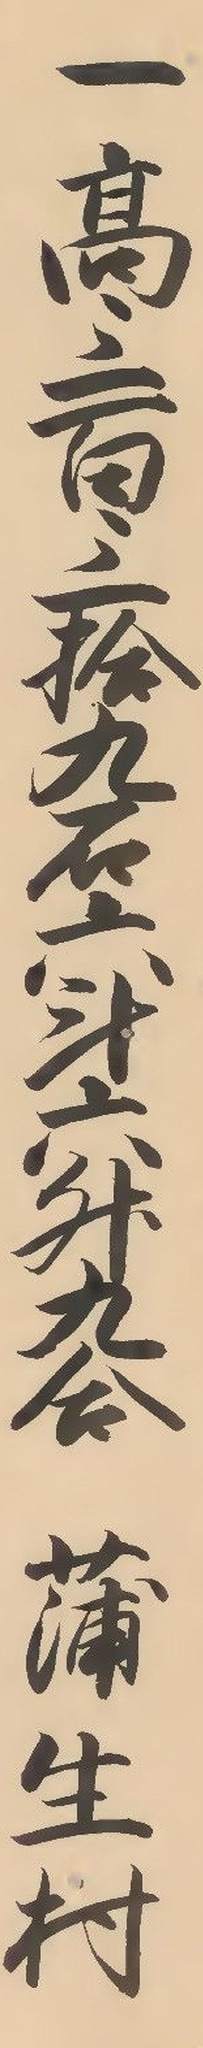一高三百三拾九石六斗六升九合蒲生村
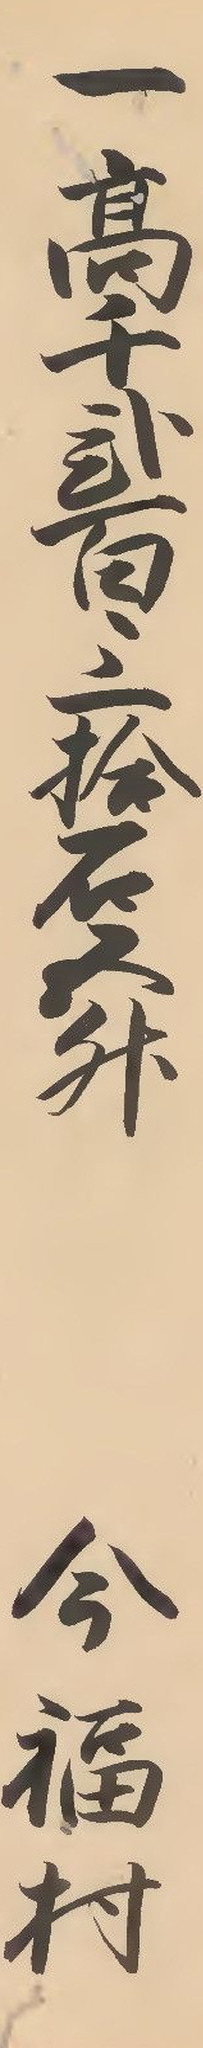一高千弐百三拾石五升今福村
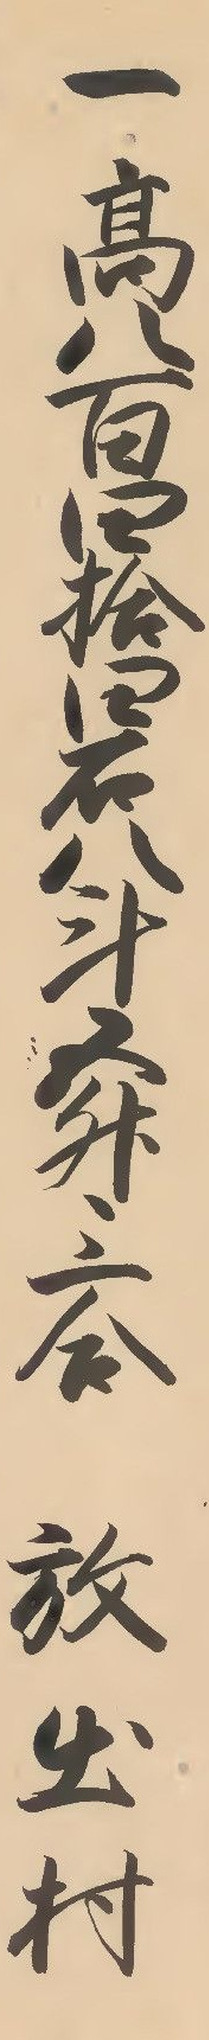一高八百四拾四石八斗五升三合放出村
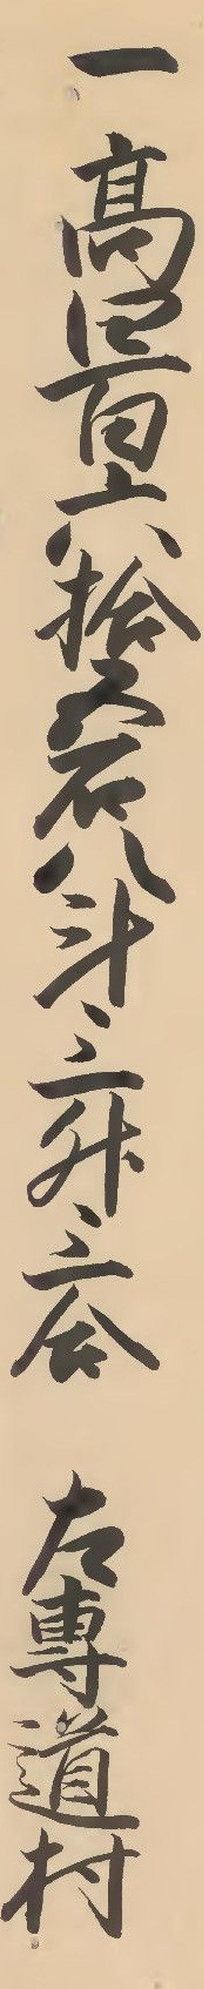一高四百六拾五石八斗三升三合左専道村
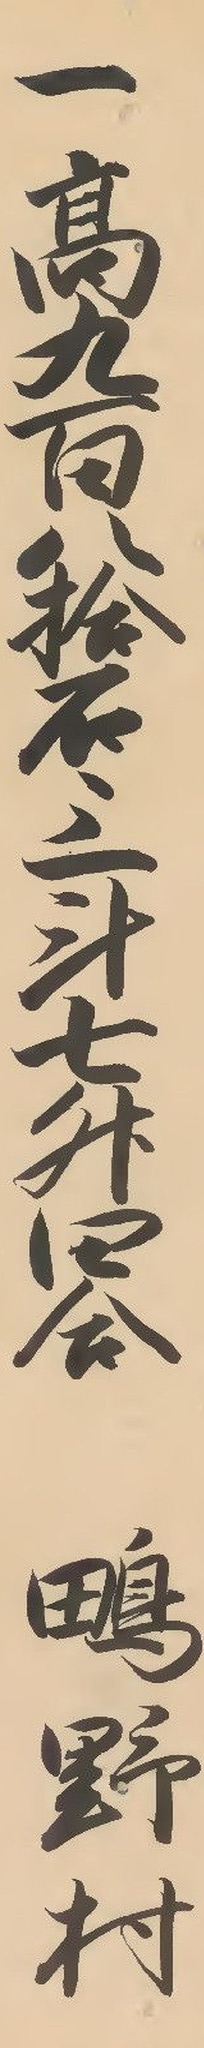一高九百八拾石三斗七升四合鴫野村
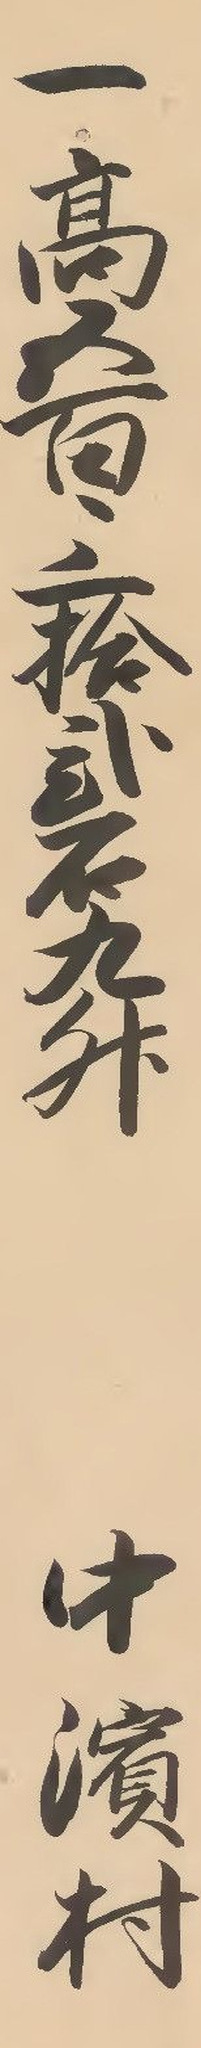一高五百三拾弐石九升中浜村
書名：摂津国郷帳
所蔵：国立公文書館 National Archives of Japan
